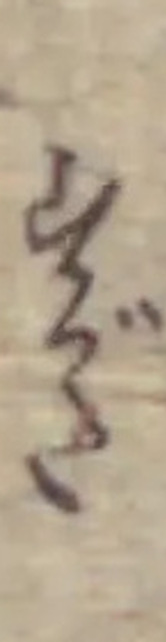すがた
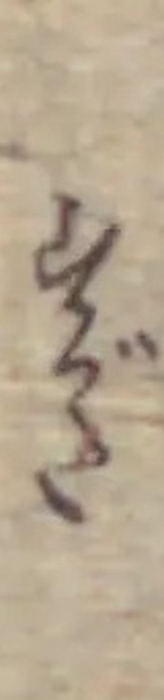すがた
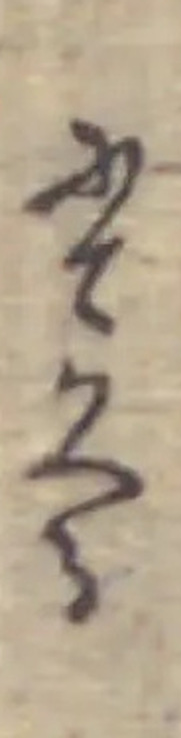にてかへる
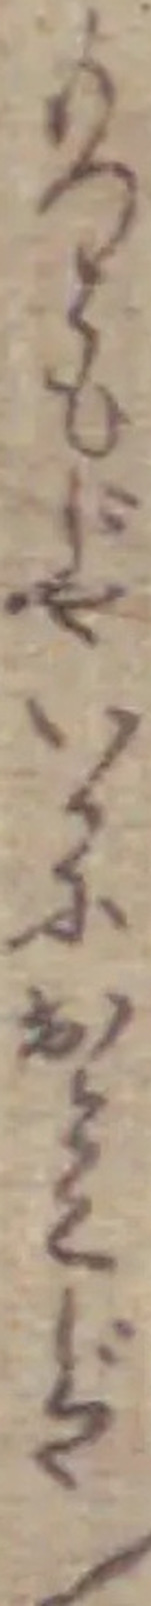もつともじやいかにおかみじや
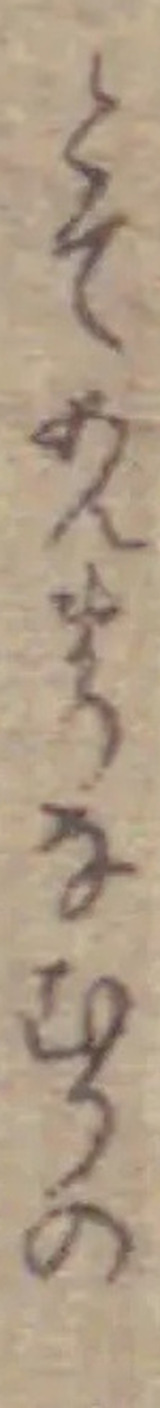とてあんまりなむりの
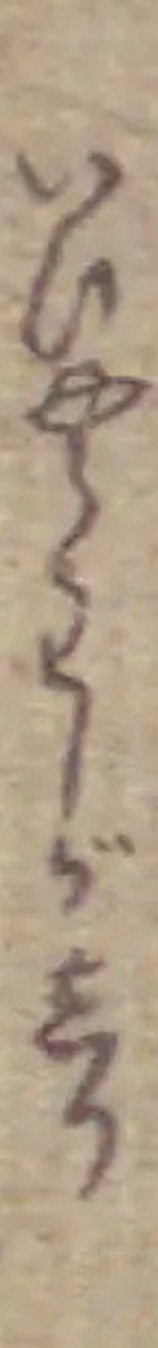いひやうわしがしり
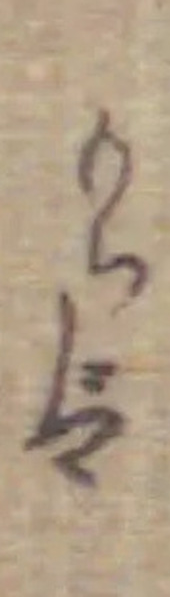もちだ

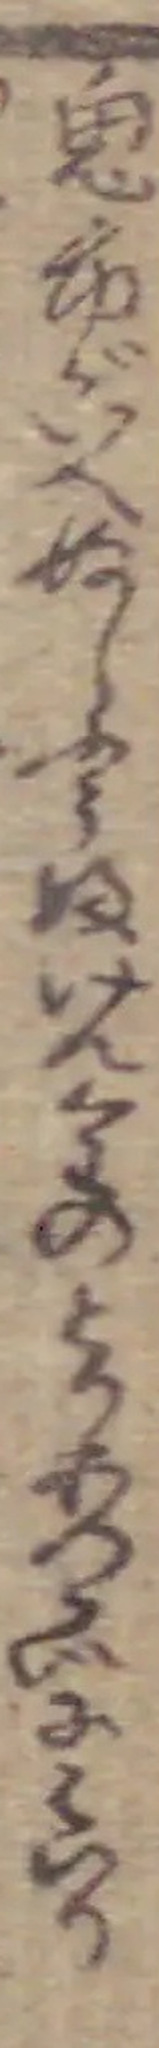鬼市がいへぬしふうふけんくわのとりあつかいにはいり
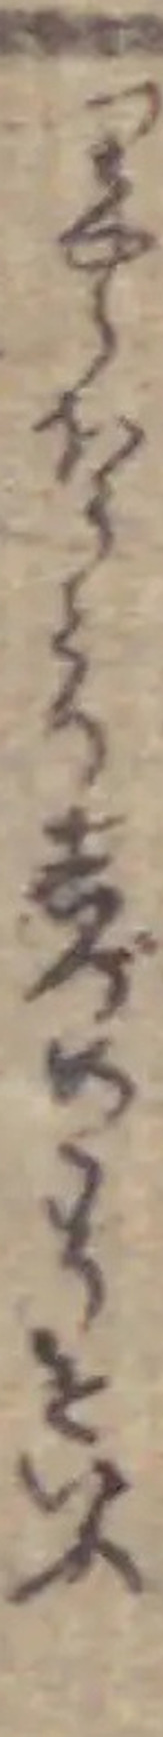りやうほうとりしずめわかをいふ
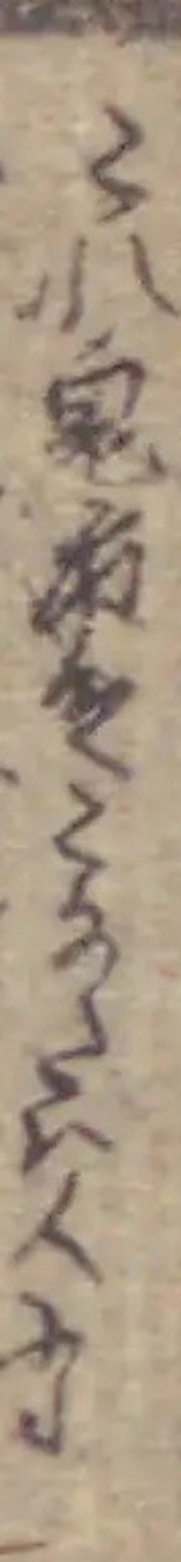これ鬼市こなたは人にす
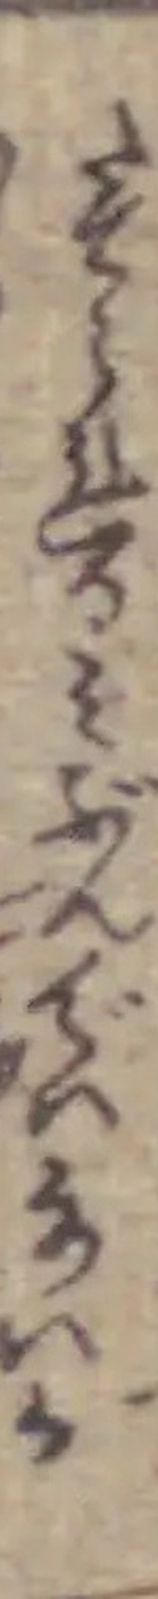たてられるみぶんではないか
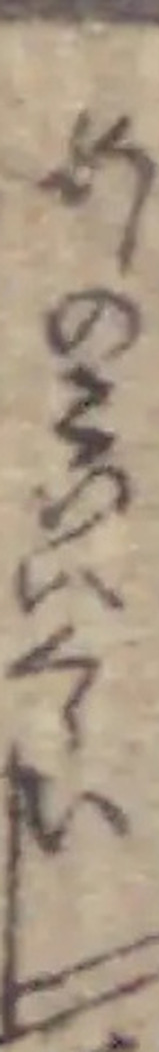めしのこはいくらい
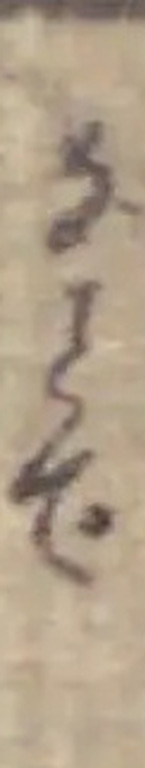なことで
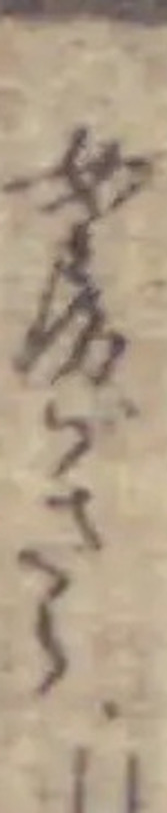女房がさら
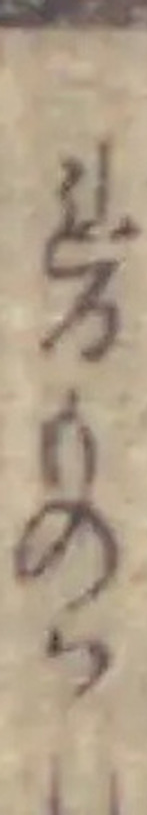れるものか
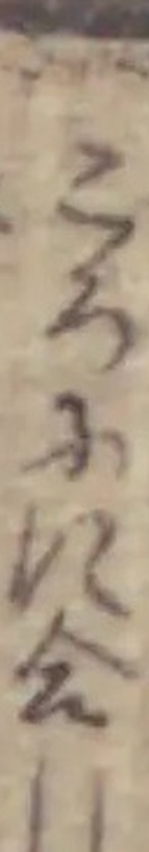ごろにに合
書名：鬼子宝 3巻
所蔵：国立国会図書館 National Diet Library, JAPAN
